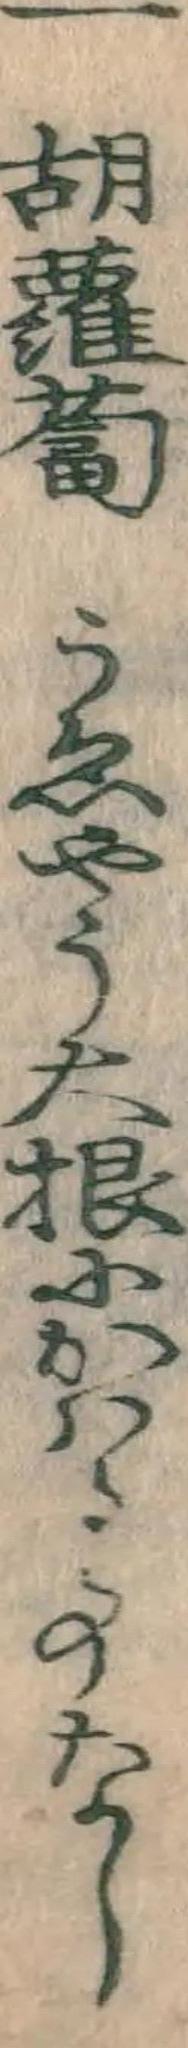一胡蘿蔔うゑやう大根にかはる事なし

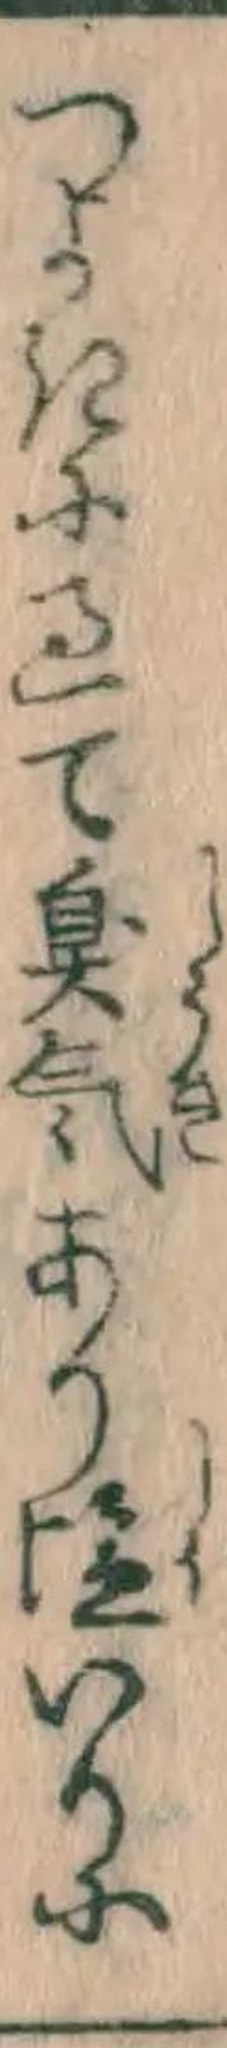つよきに過て臭気あり塩いりに
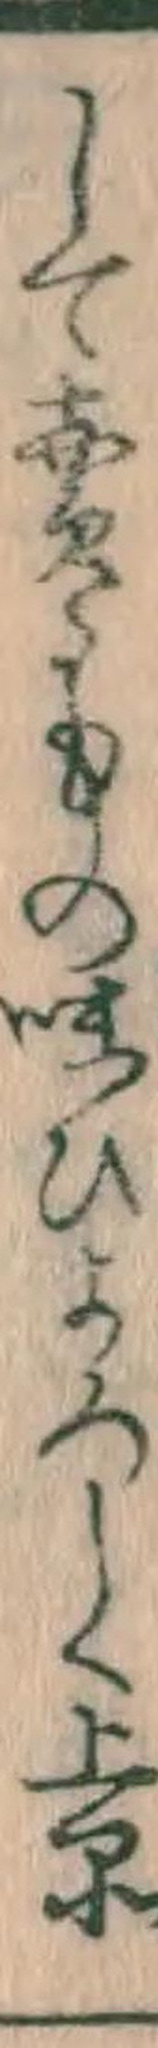して売るもの味ひよろしく上品
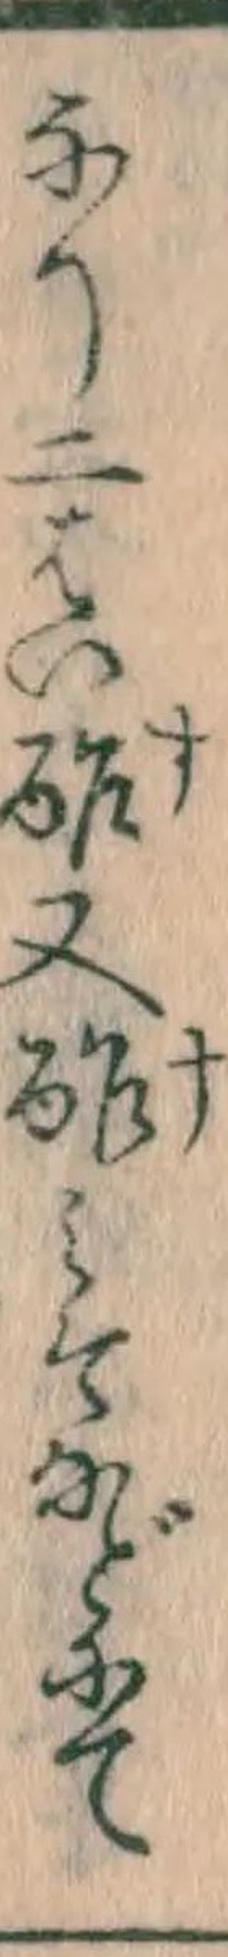なり二はい酢又酢みそなどにて
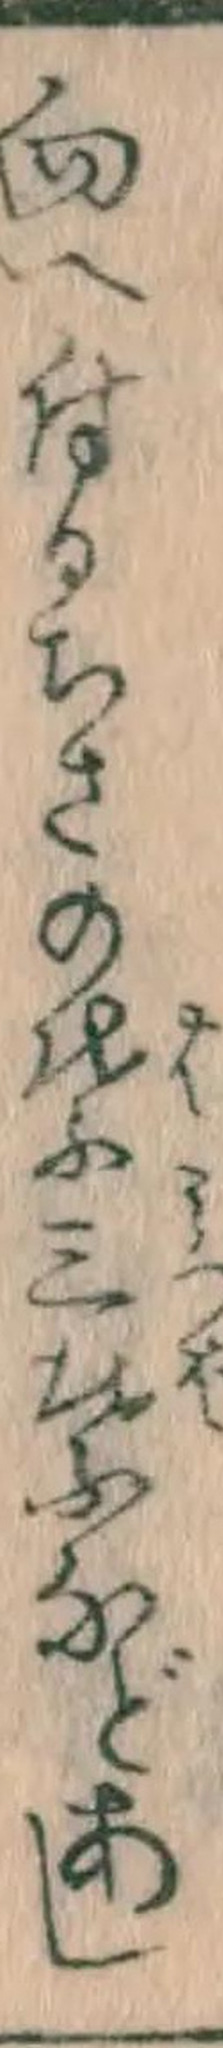向へ付るちさの葉三葉などあし
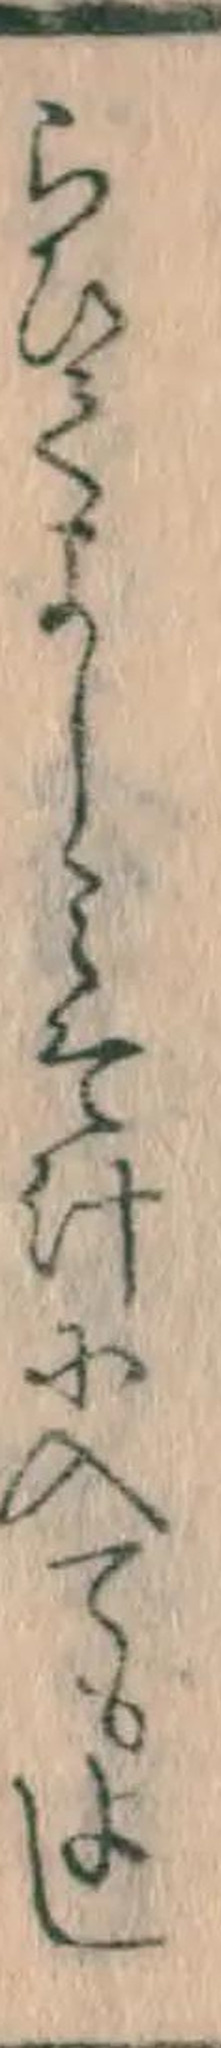らひてよしみそ汁に入てもよし
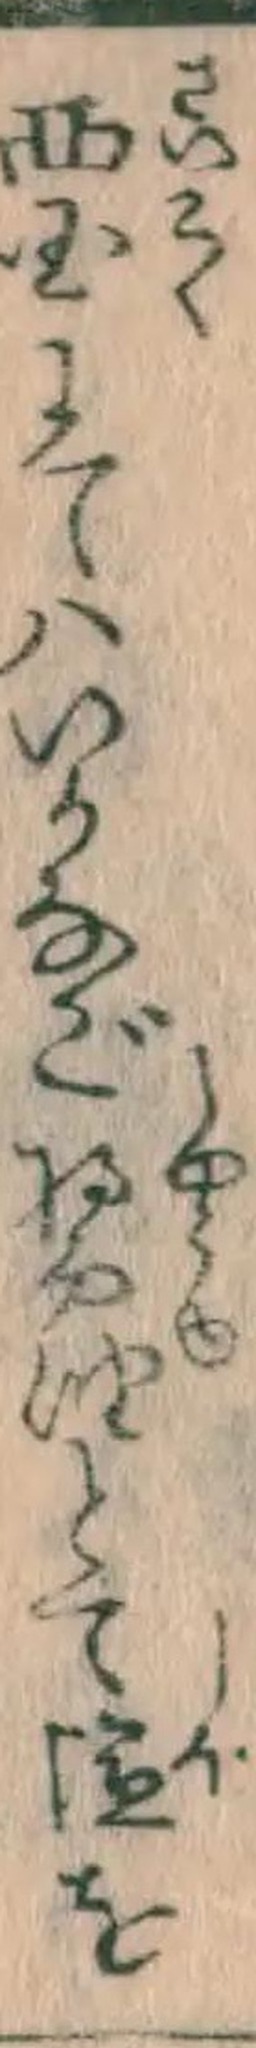西国にてはいかなご醬油とて塩を
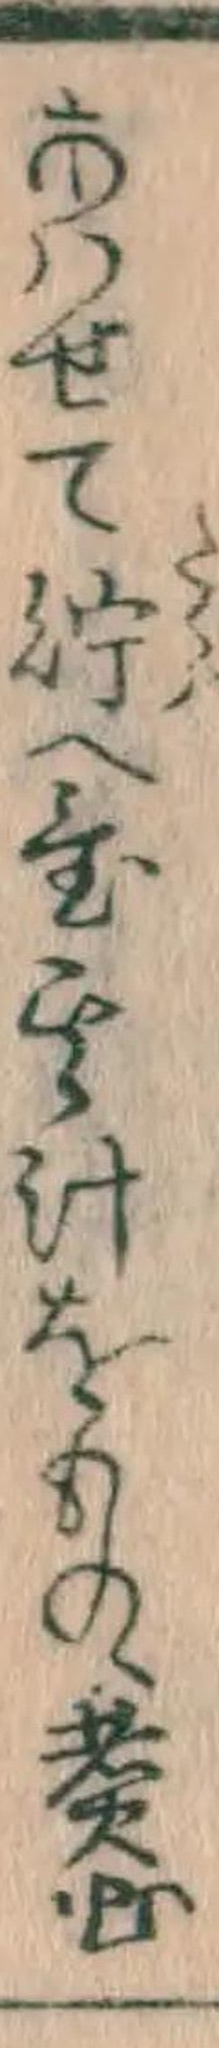あはせて貯へ置其汁をものゝ煮出
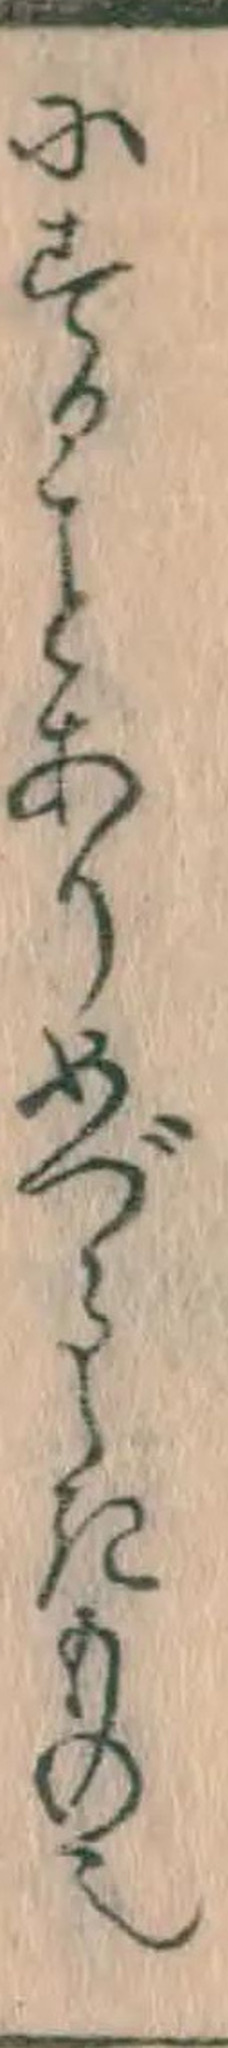にすることありめづらしきもの也
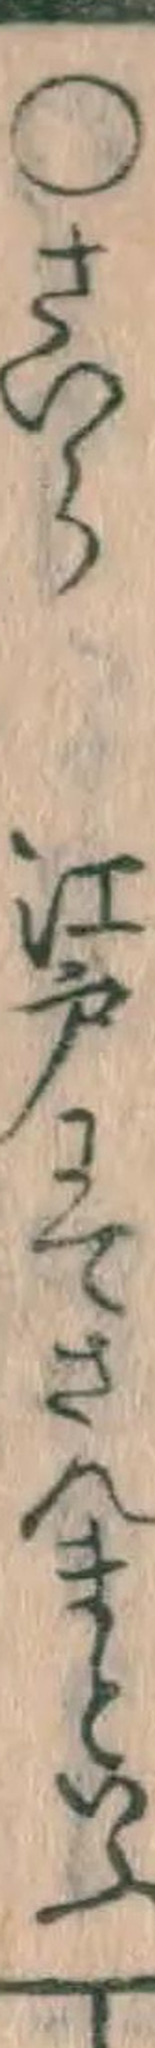○さいら江戸にてさんまといふ
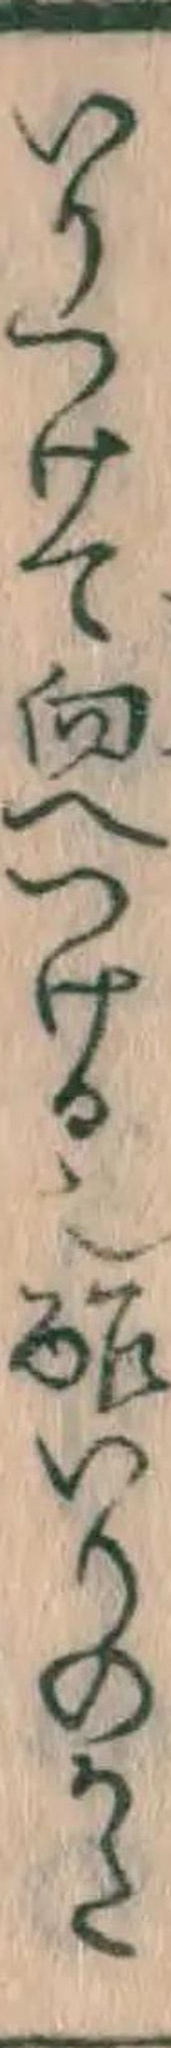いりつけて向へつける也酢いりのかた
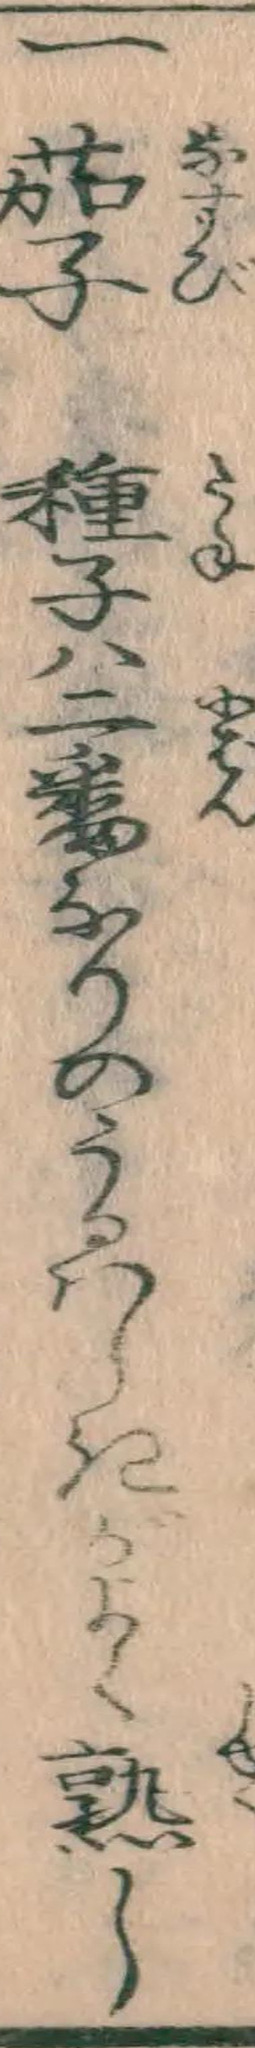一茄子種子は二番なりのうるはしきがよく熟し
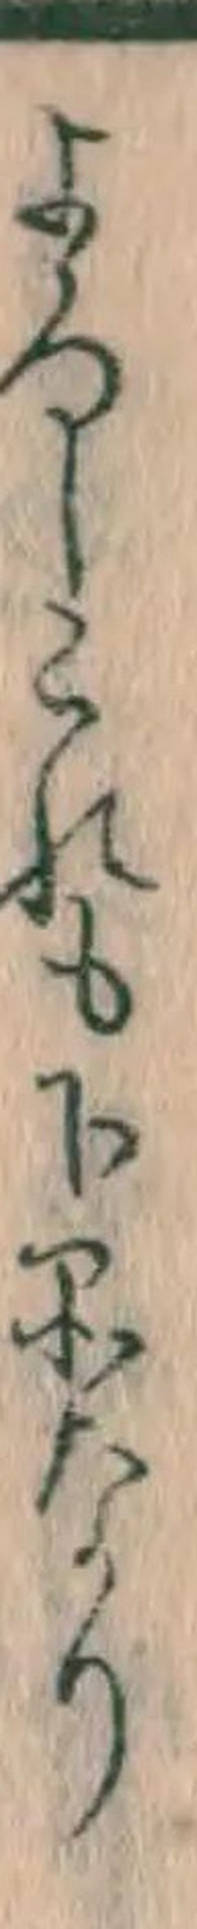よろしこれも下品なり
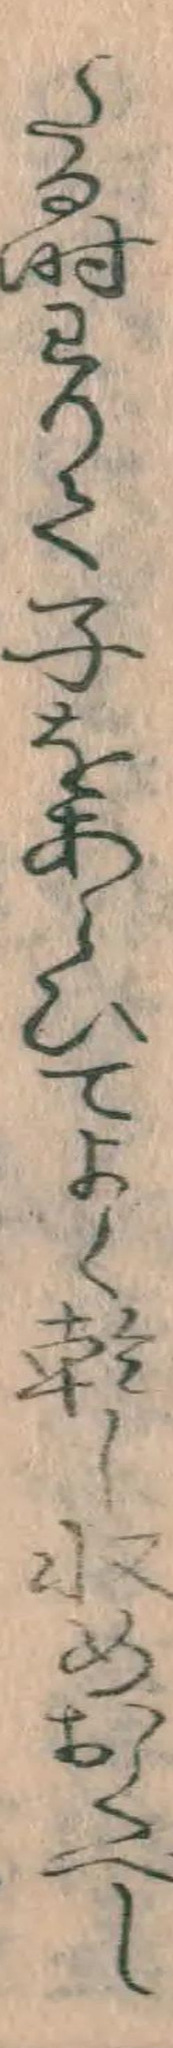たる時わりて子をあらひてよく乾し収めおくべし
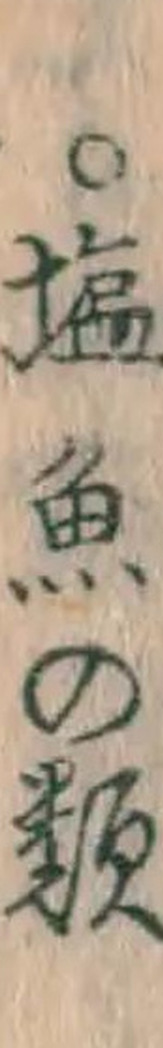◦塩魚の類
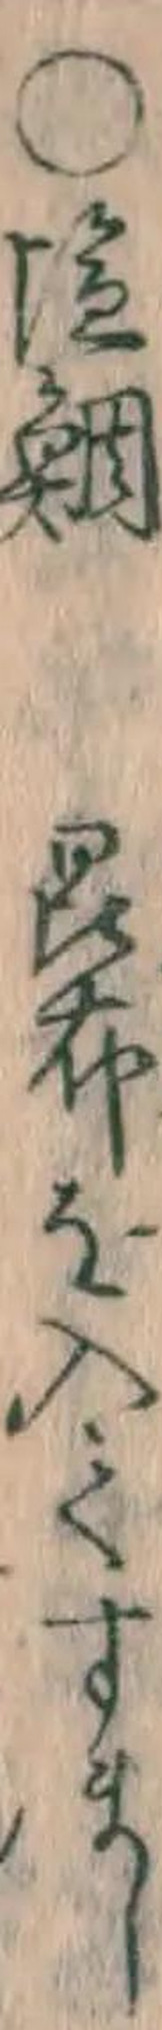○塩鯛昆布を入てすまし
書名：広益秘事大全 3巻. [5]
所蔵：国立国会図書館 National Diet Library, JAPAN
